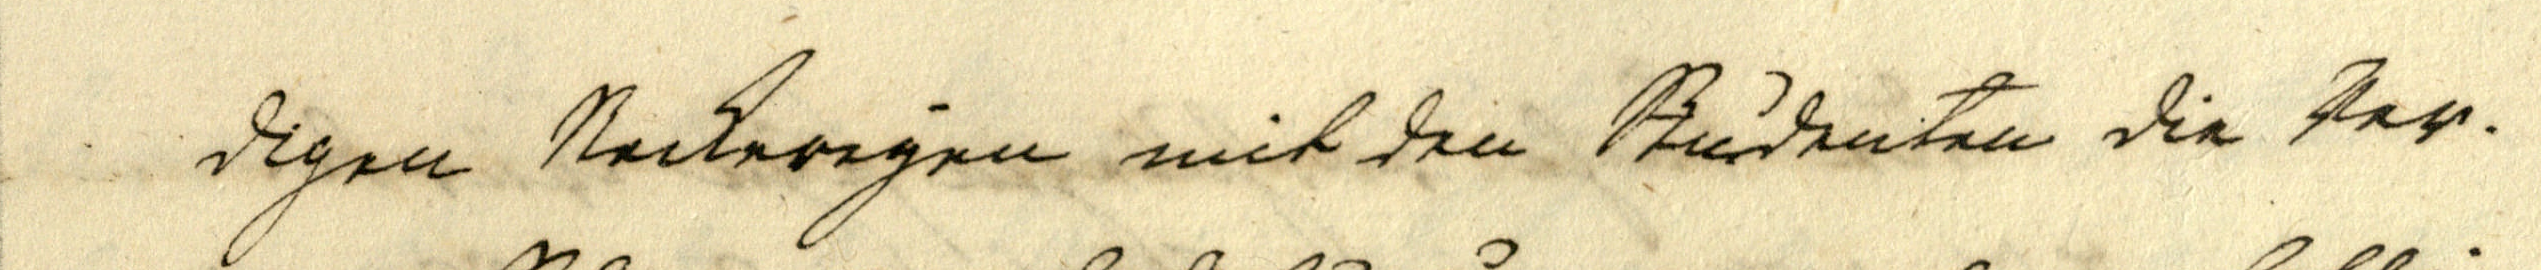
digen Neckereyen mit den Studenten die Ver-
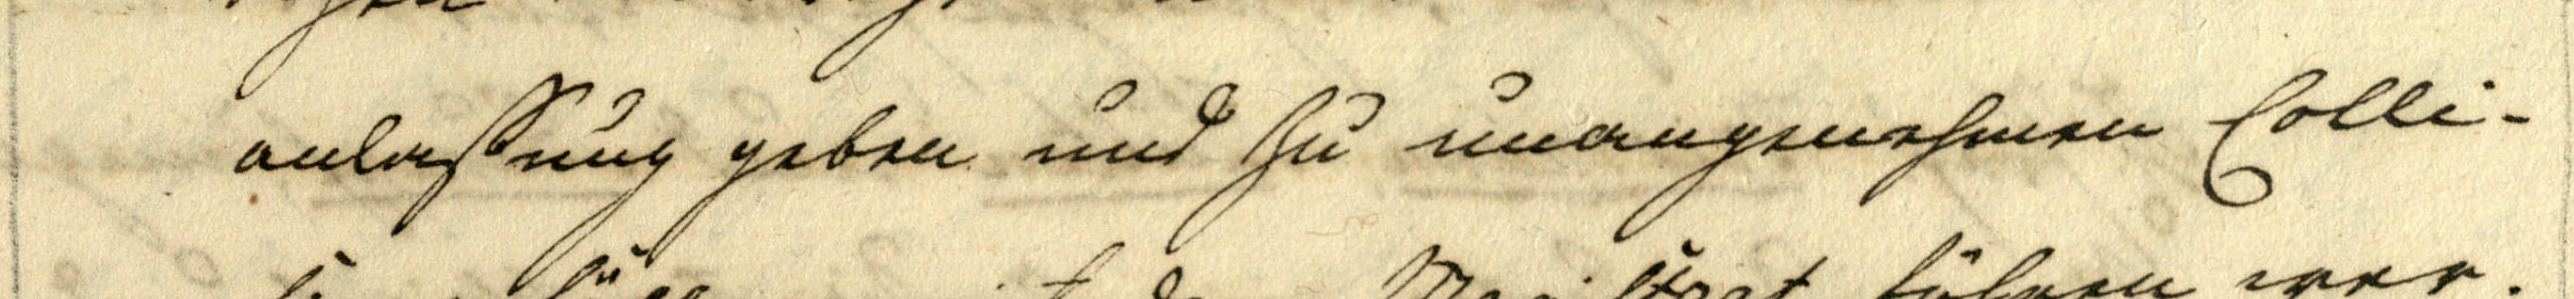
anlassung geben und zu unangenehmen Colli-
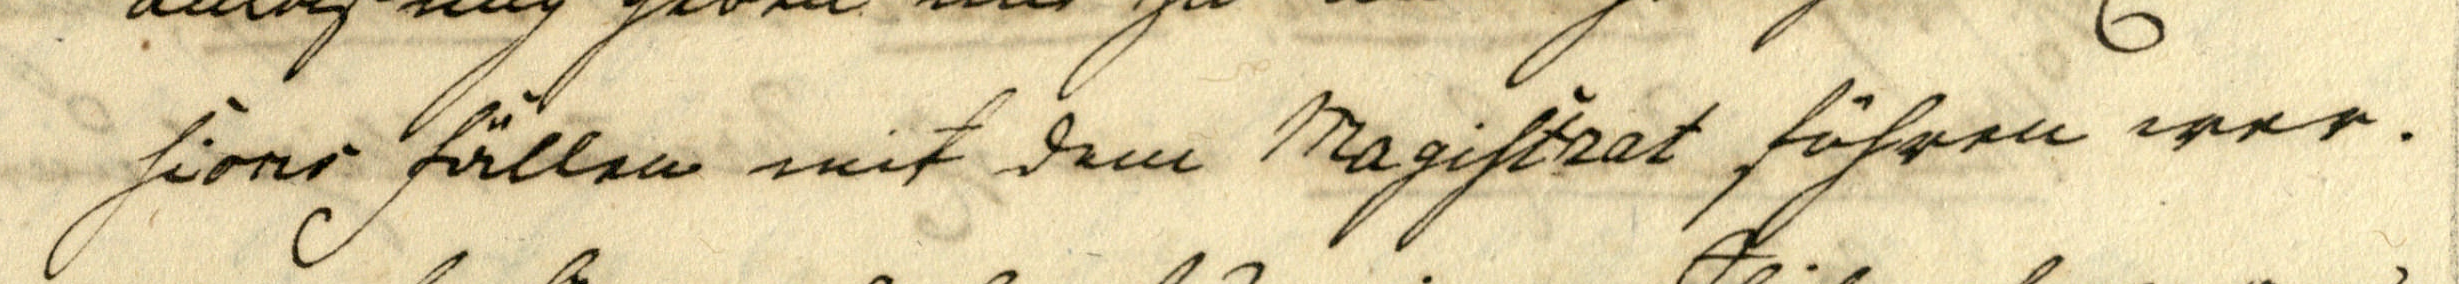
sions fällen mit dem Magistrat führen wer-
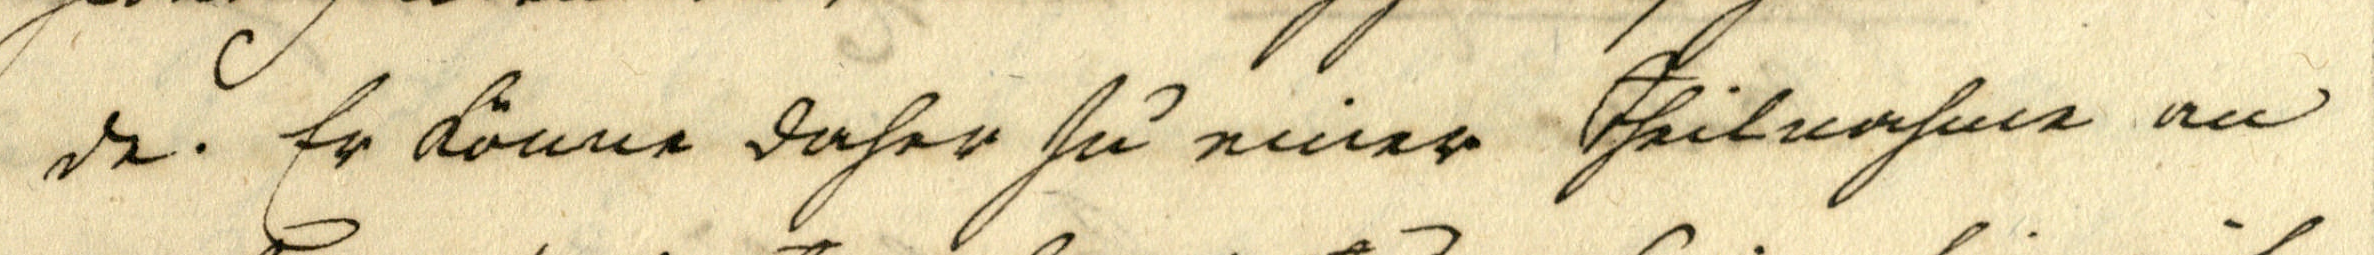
de. Er könne daher zu einer Theilnahme an
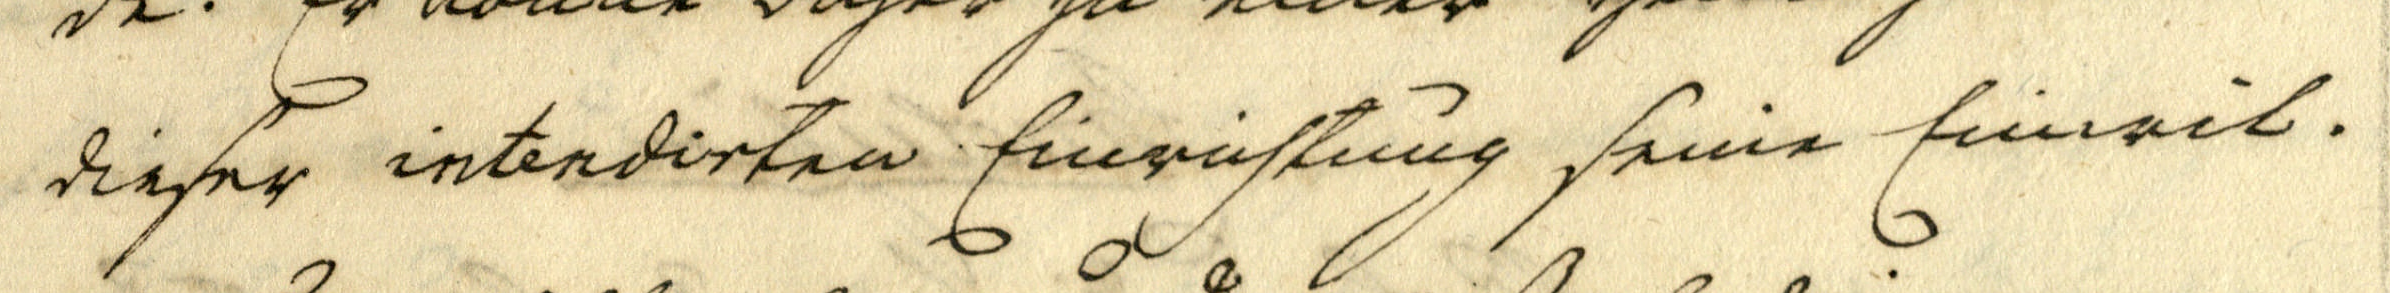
dieser intendierten Einrichtung seine Einwil-
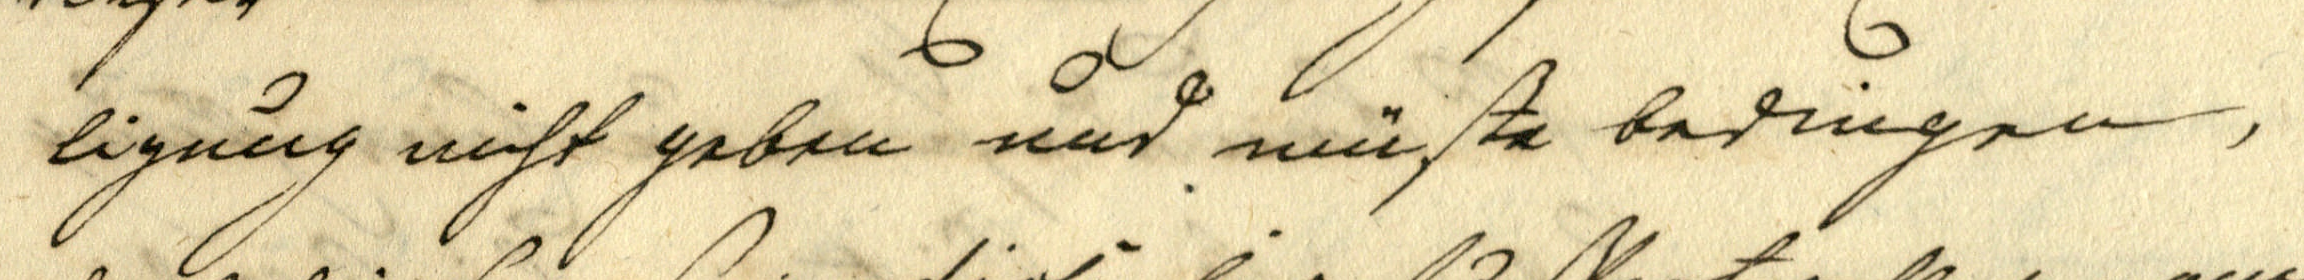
ligung nicht geben und mußte bedingen,
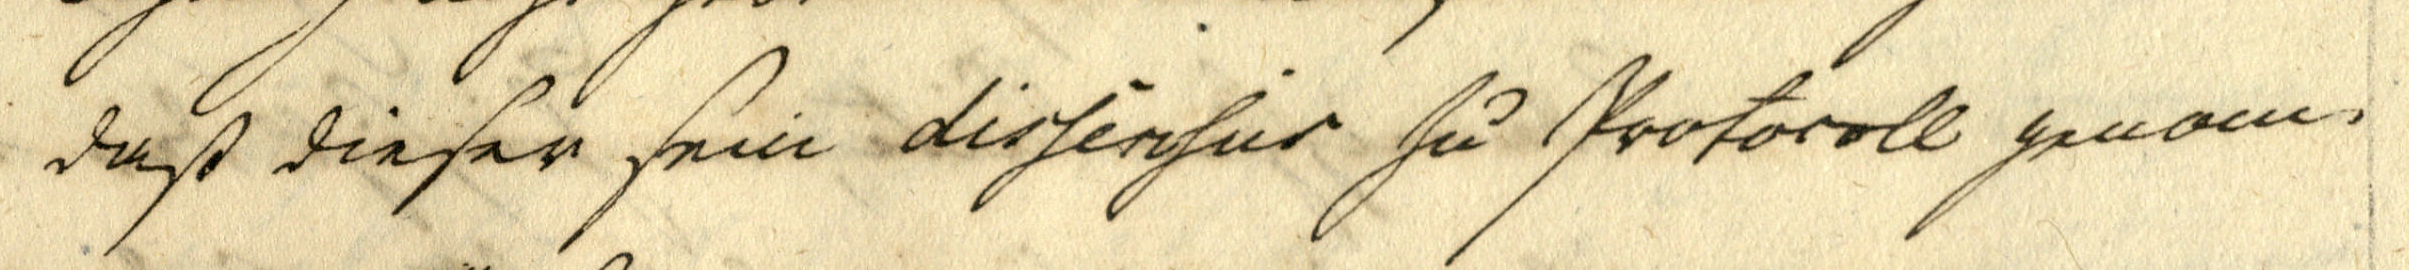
daß dieser sein dissensus zu Protocoll genom-
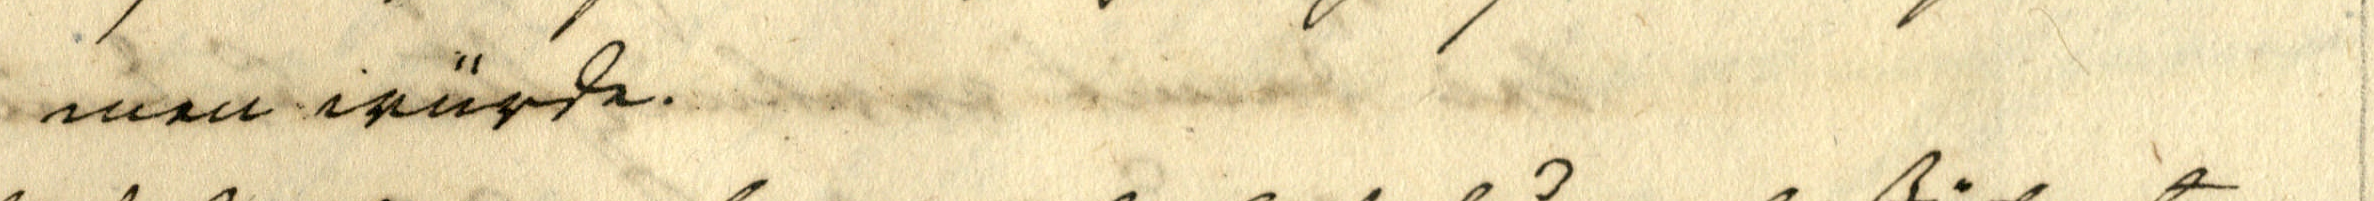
men würde.
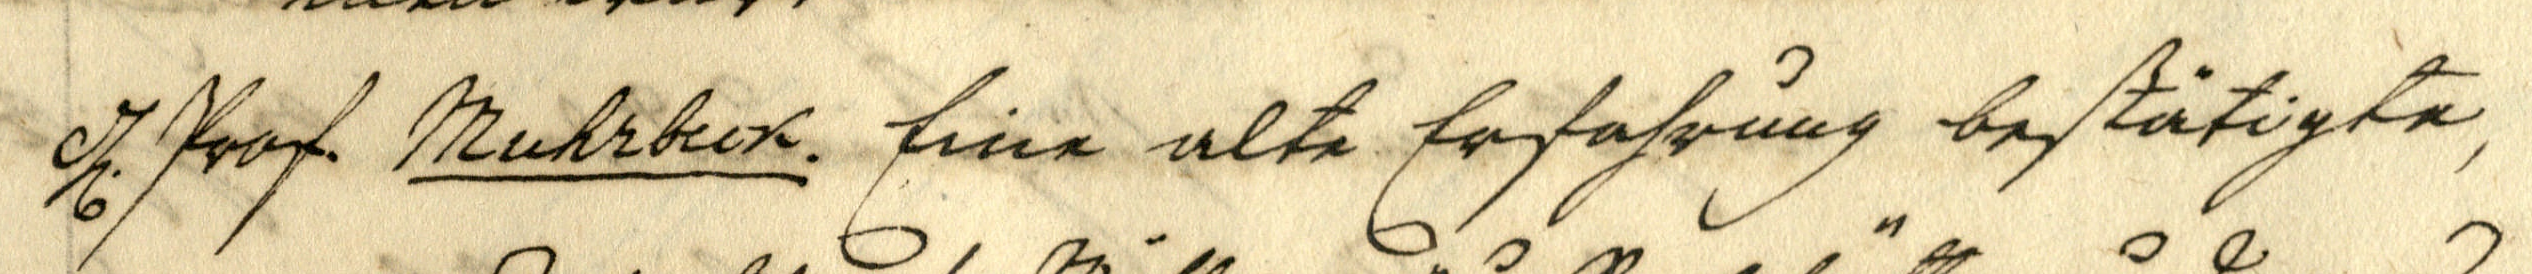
dh. Prof. Muhrbeck. Eine alte Erfahrung bestätgite,
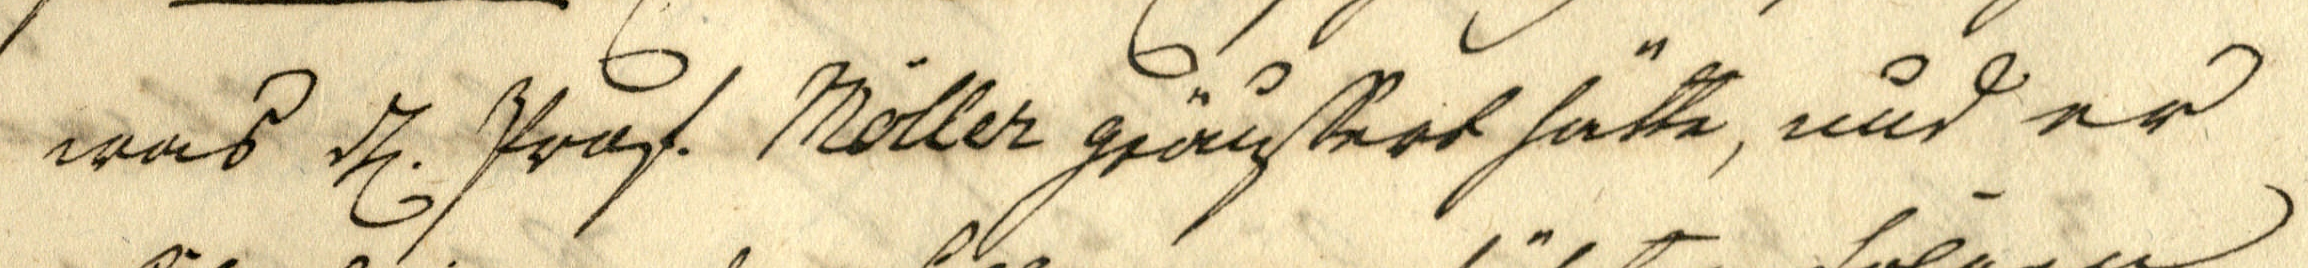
was dh. Prof. Möller geäussert hätte, und er
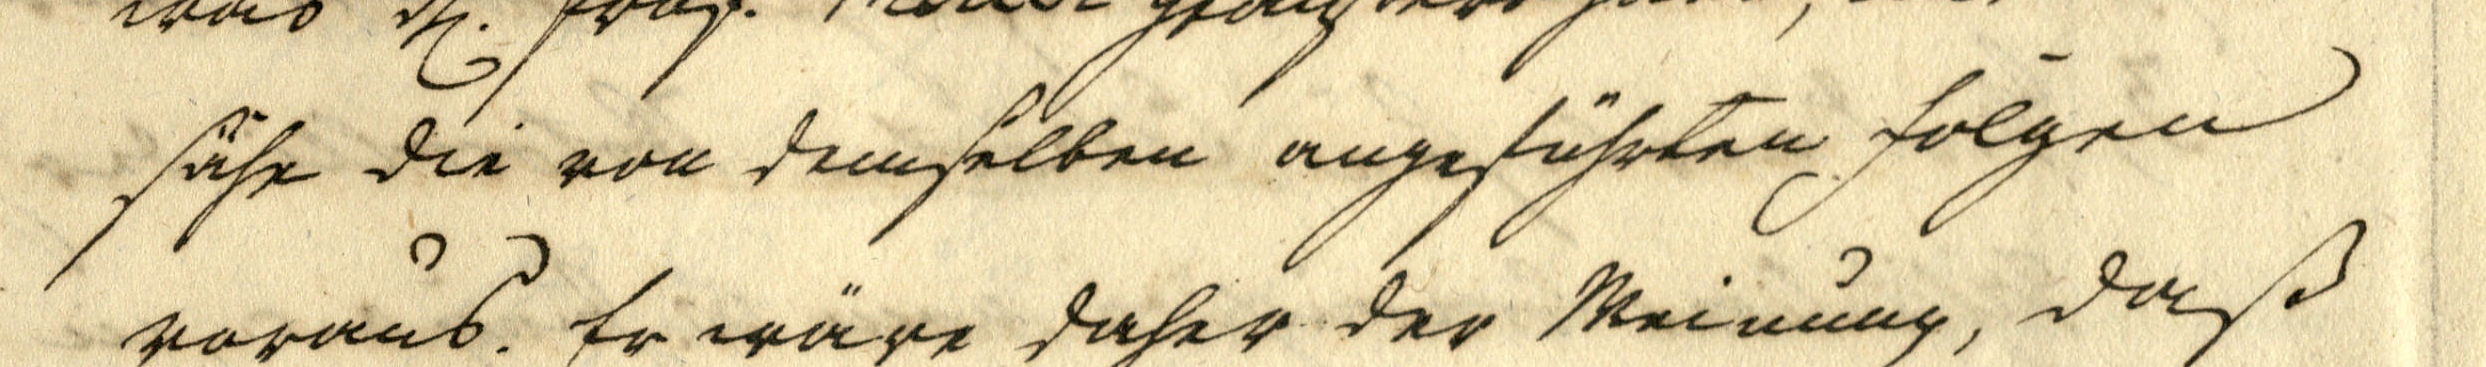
sähe die von demselben angeführten Folgen
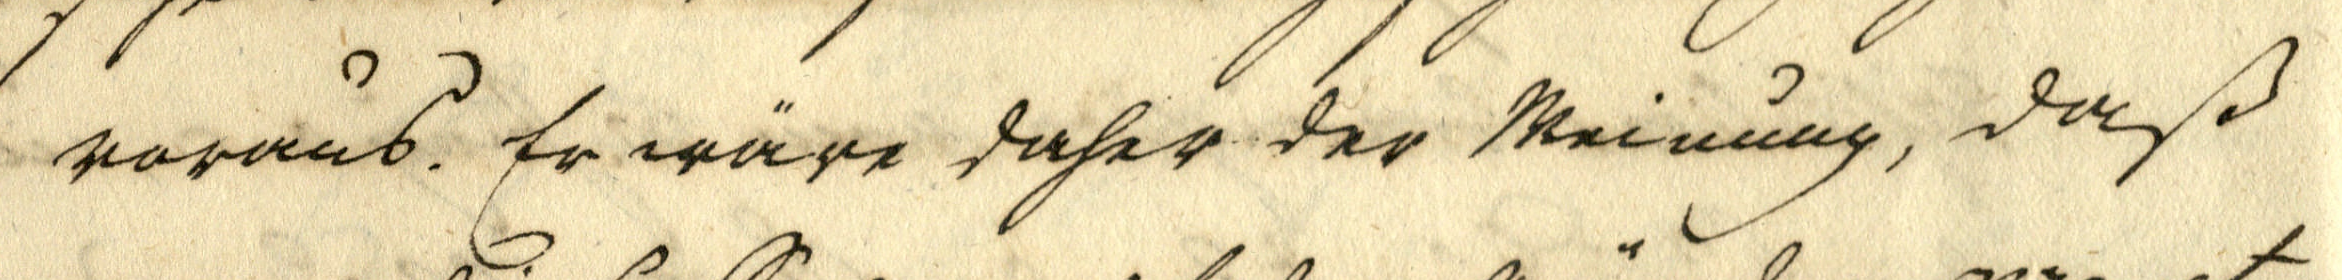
voraus. Er wäre daher der Meinung, daß
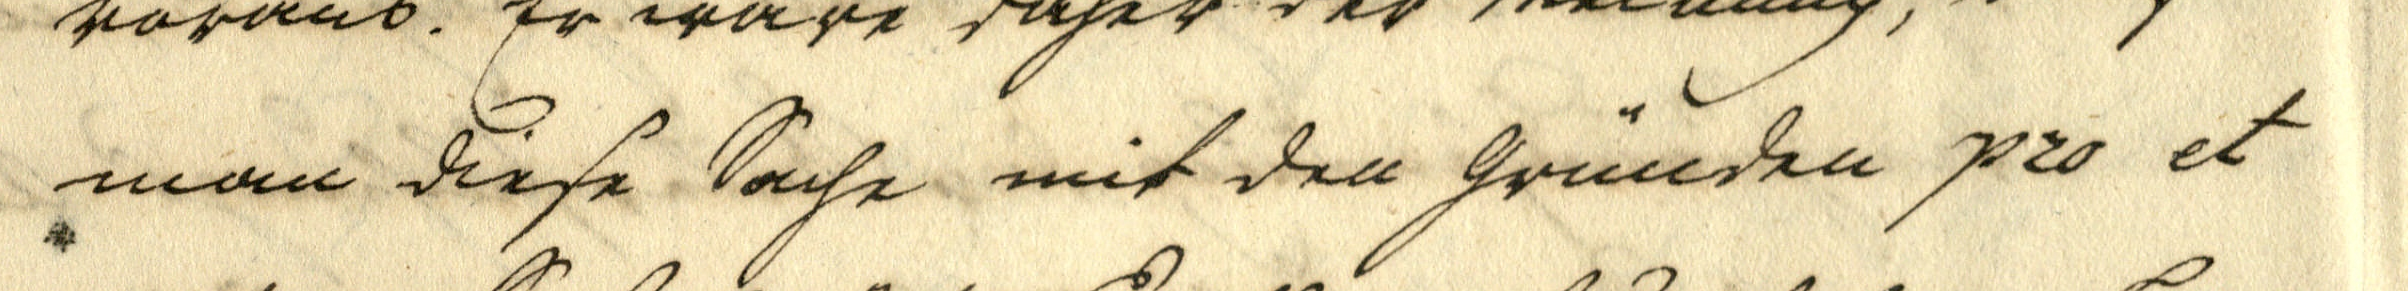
man diese Sache mit den Gründen pro et
